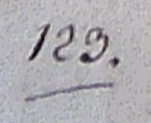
123.
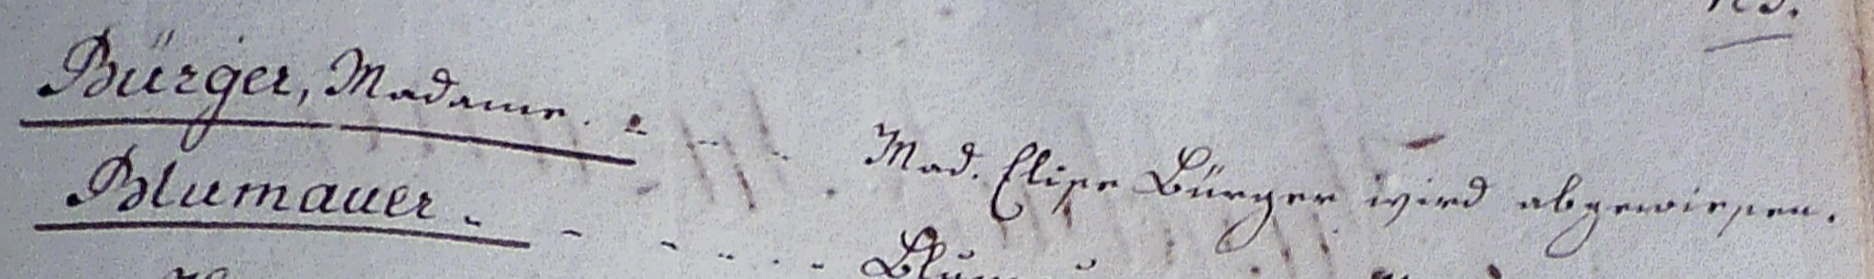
Bürger, Madame. .. .. .. Mad. Elise Bürger wird abgewiesen.
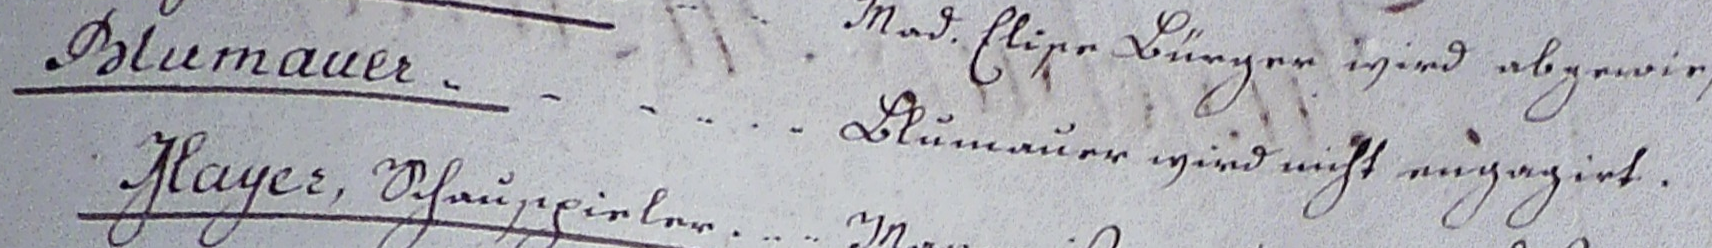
Blumauer .. .. .. .. . .. Blumauer wird nicht engagirt.
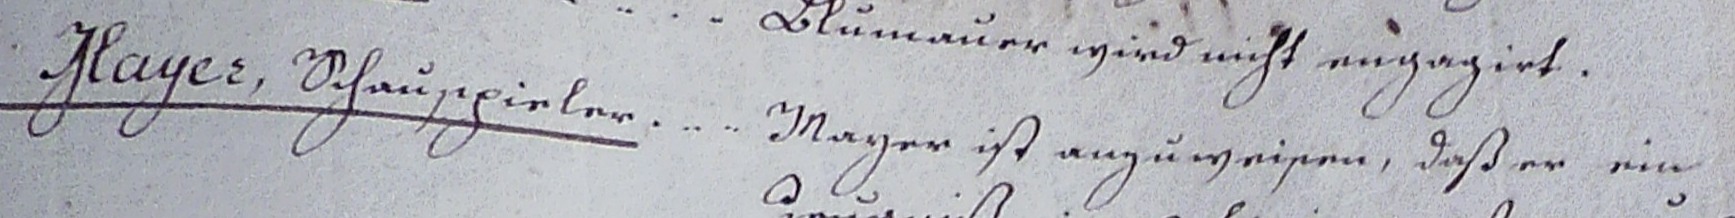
Mayer, Schauspieler. .. .. Mayer ist anzuweisen, daß er ein
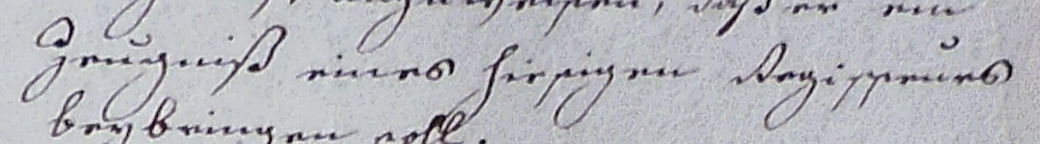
Zeugniß eines hiesigen Regisseurs
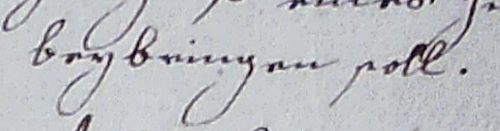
beybringen soll.
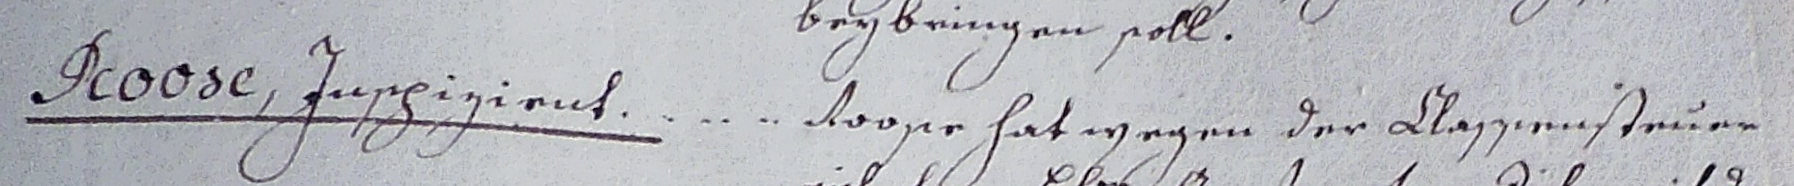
Roose, Inspizient. . .. .. Roose hat wegen der Classensteuer
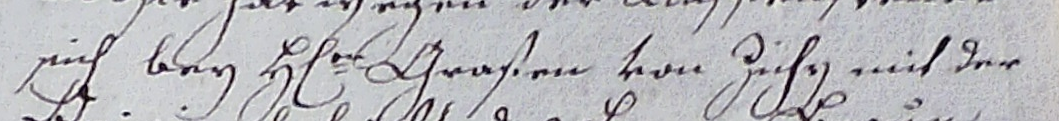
sich bey HEe͇r Grafen von Zichy mit der
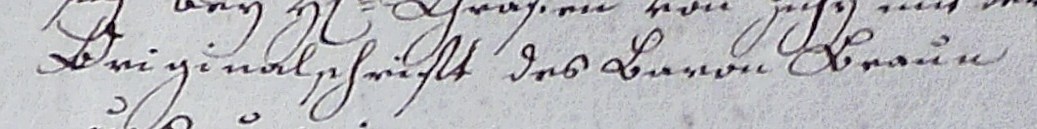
Originalschrift des Baron Braun
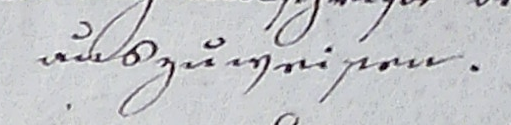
auszuweisen.
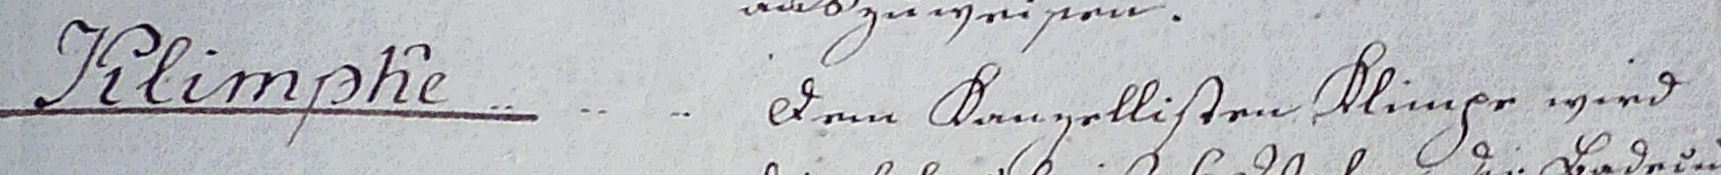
Klimpke .. .. .. Dem Kanzellisten Klimpe wird
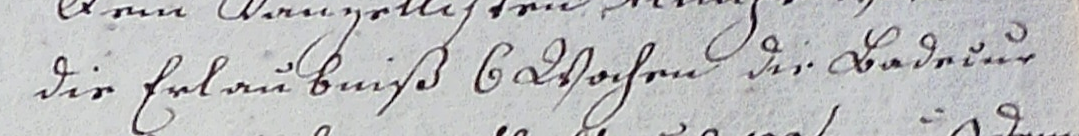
die Erlaubniß 6 Wochen die Badecur
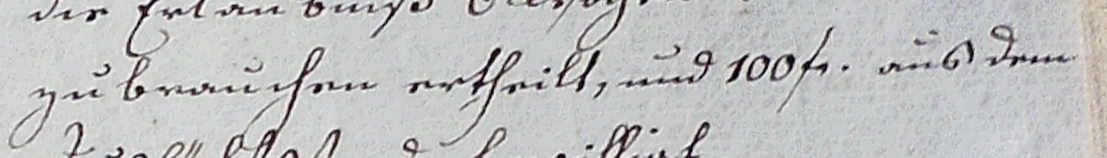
zu brauchen ertheilt, und 100fr. aus dem
